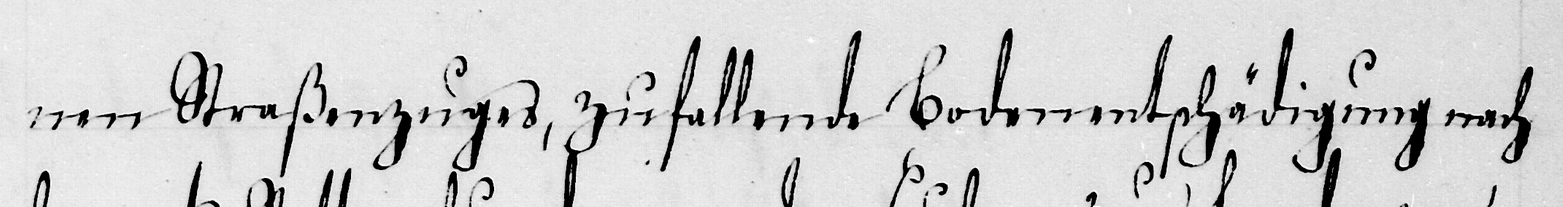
nen Straßenzuges, zufallende Bodenentschädigung nach
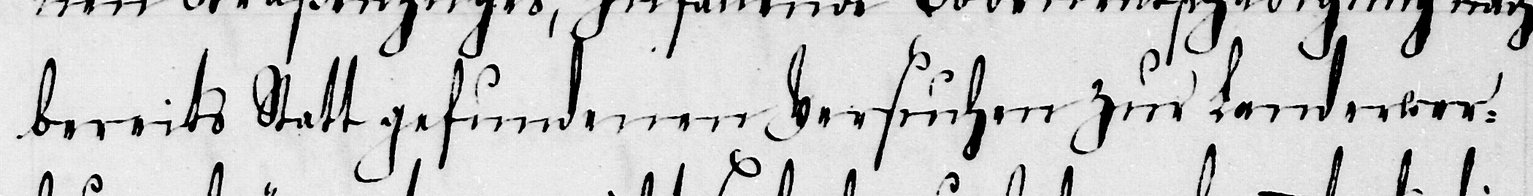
bereits Statt gefundenen Versuchen zur Landerwer¬
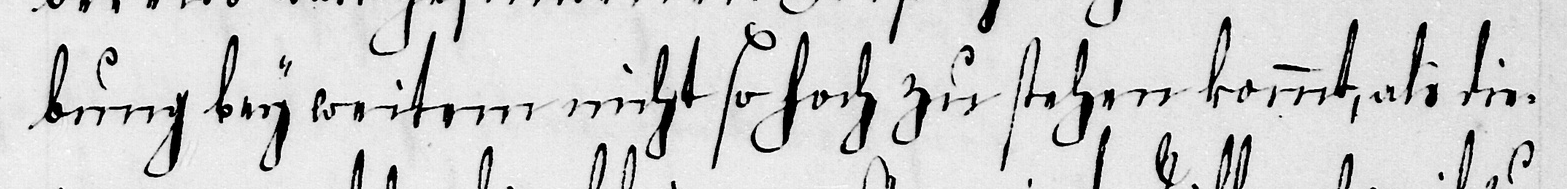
bung bey weitem nicht so hoch zu stehen kommt, als die¬
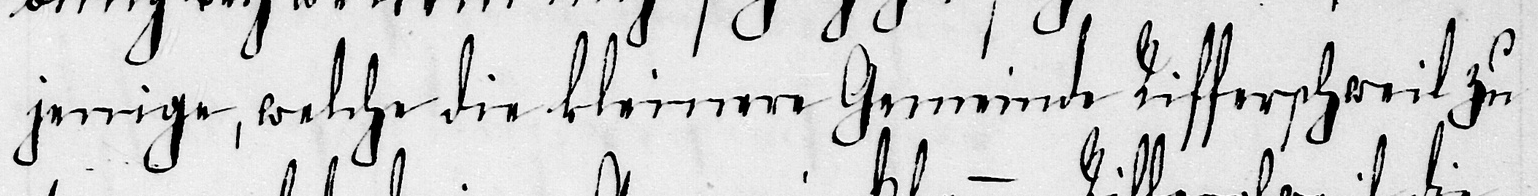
jenige, welche die kleinere Gemeinde Rifferschweil zu
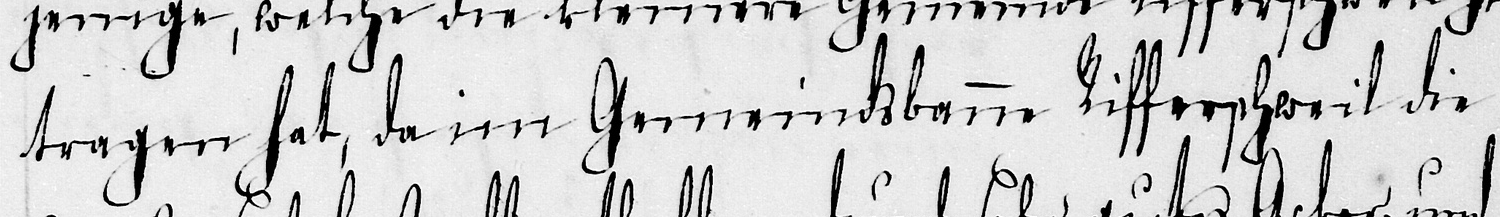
tragen hat, da im Gemeindsbanne Rifferschweil die
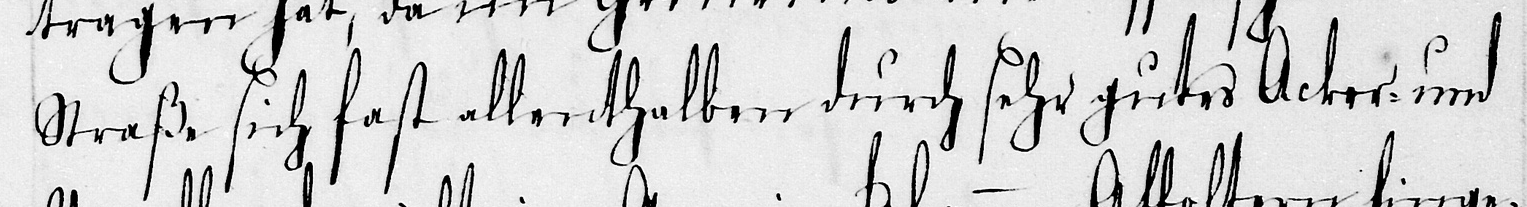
Straße sich fast allenthalben durch sehr gutes Acker- und
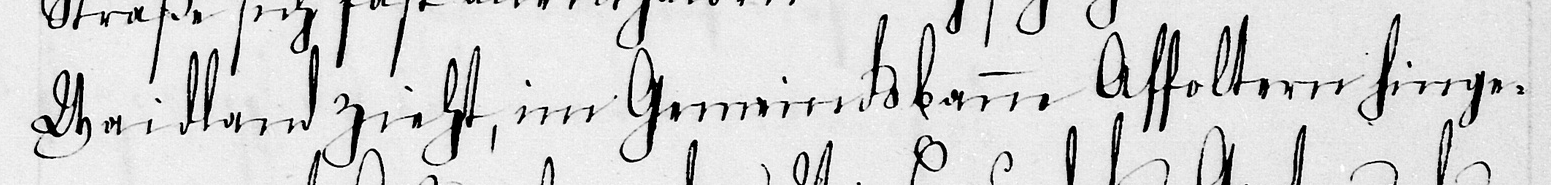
Waidland zieht, im Gemeindsbanne Affoltern hinge¬
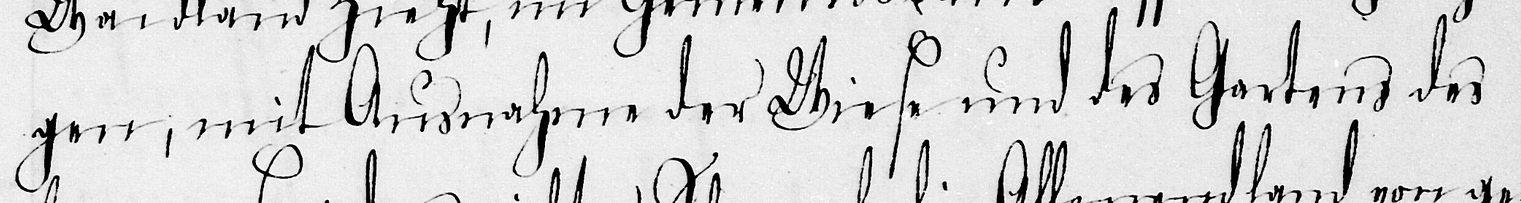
gen; mit Ausnahme der Wiese und des Gartens des
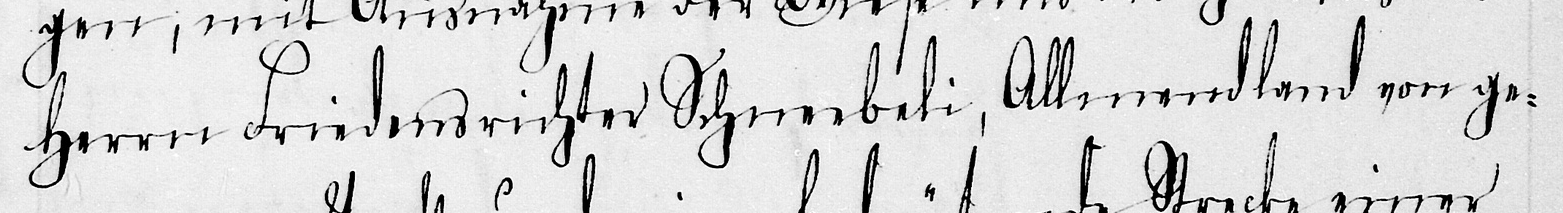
Herrn Friedensrichter Schneebeli, Allmendland von ge¬
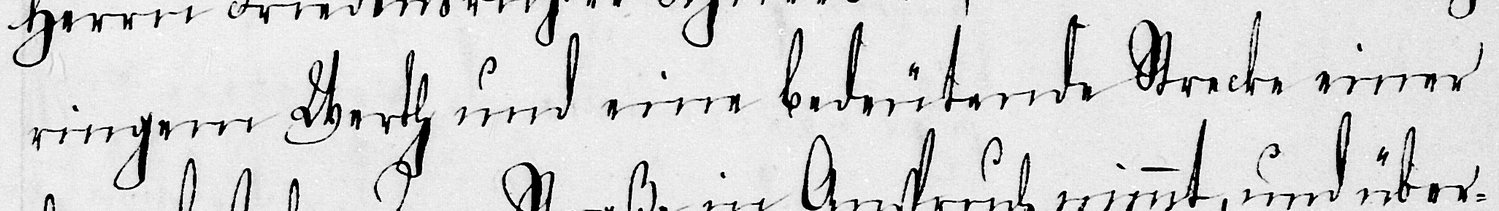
ringem Werth und eine bedeutende Strecke einer
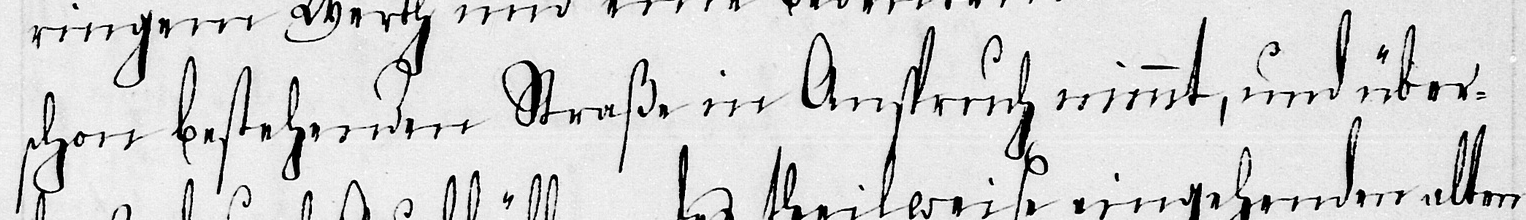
schon bestehenden Straße in Anspruch nimmt, und über¬
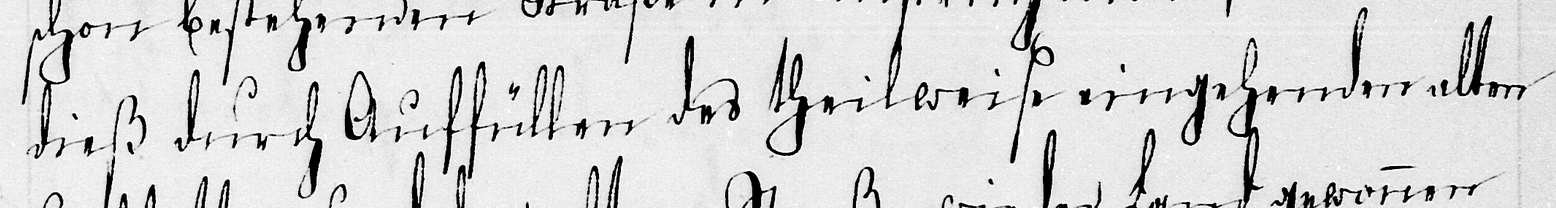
dieß durch Auffüllen des theilweise eingehenden alten
